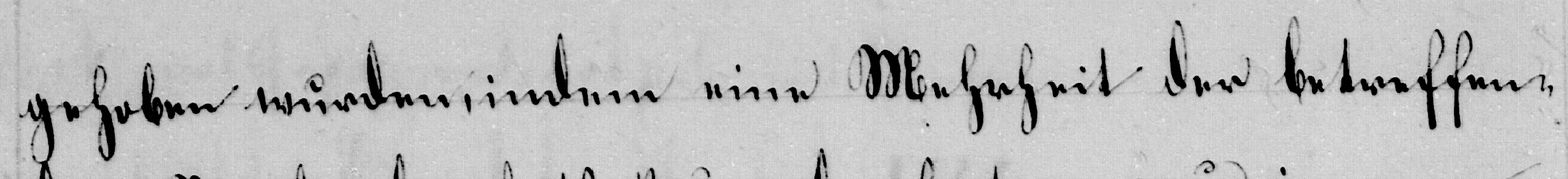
gehoben wurden, indem eine Mehrheit der betreffen¬
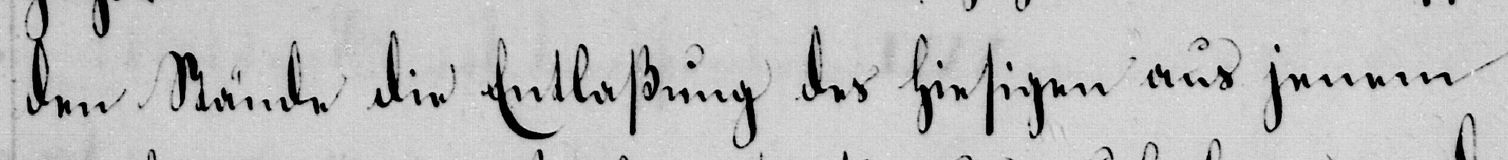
den Stände die Entlaßung des hiesigen aus jenem
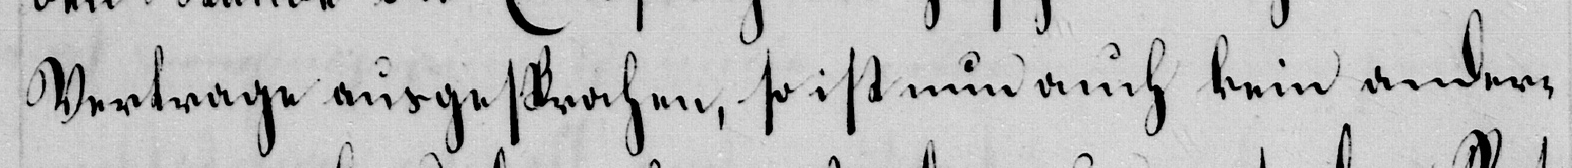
Vertrage ausgesprochen, so ist nun auch kein ander¬
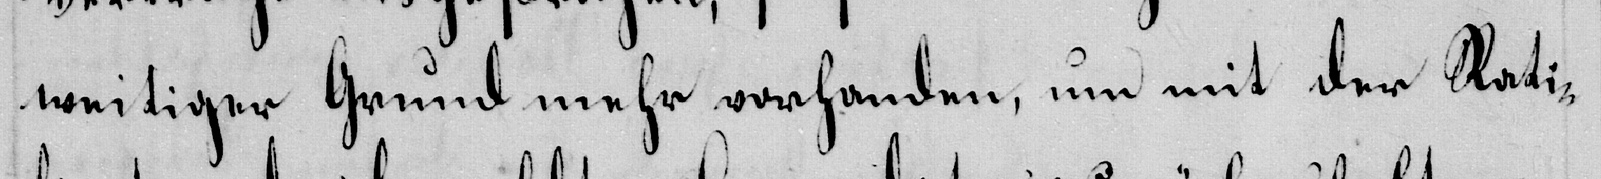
weitiger Grund mehr vorhanden, um mit der Rati¬
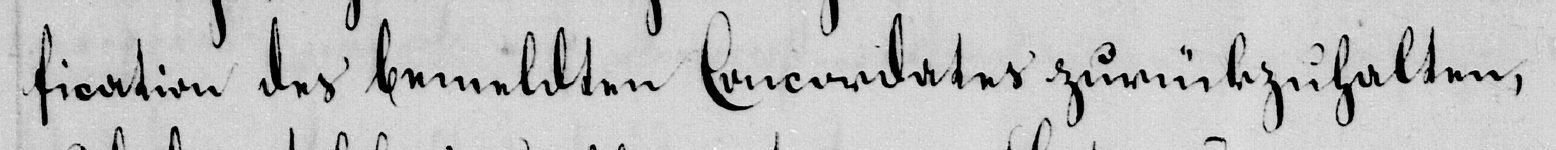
fication des bemeldeten Concordates zurückzubehalten,
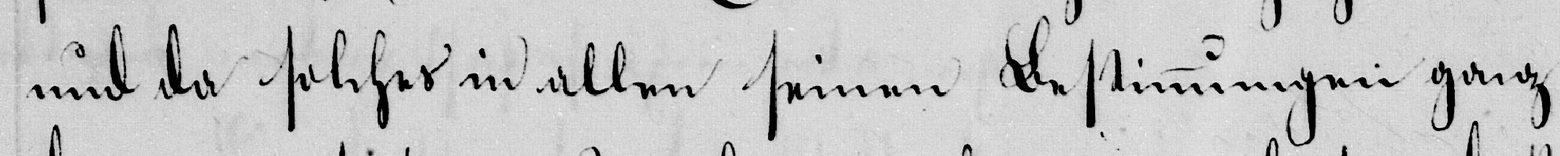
und das solches in allen seinen Bestimmungen ganz
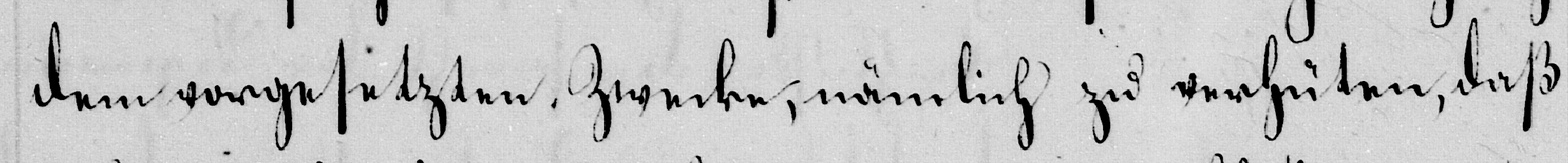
dem vorgesetzten Zwecke, nämlich zu verhüten, daß
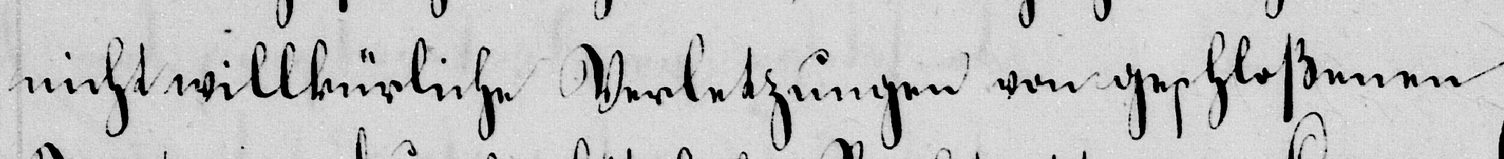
nicht willkürliche Verletzungen von geschloßenen
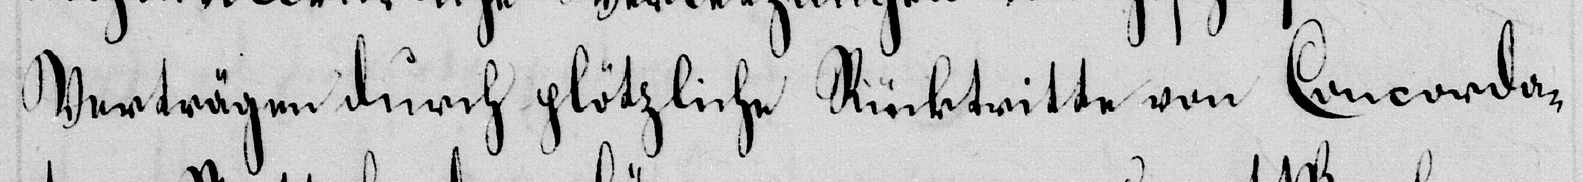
Verträgen durch plötzliche Rücktritte von Concorda¬
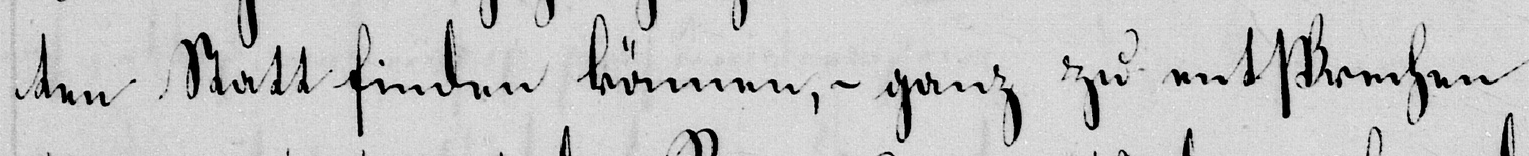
ten Statt finden können, – ganz zu entsprechen
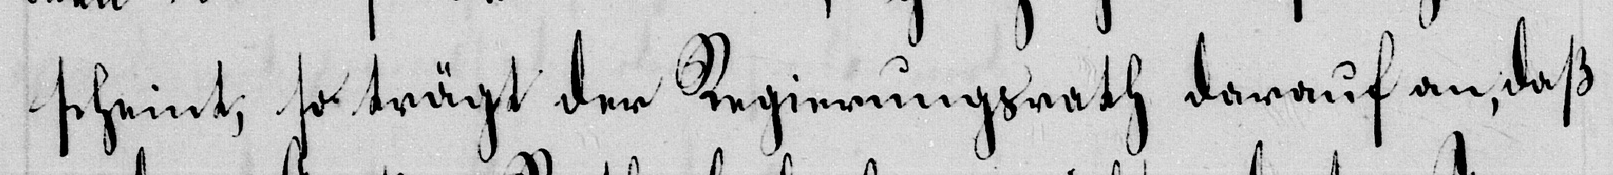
scheint, so trägt der Regierungsrath darauf an, daß
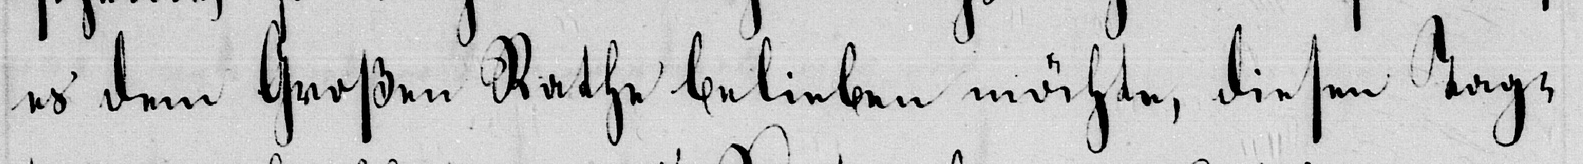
es dem Großen Rathe belieben möchte, diesen Tag¬
